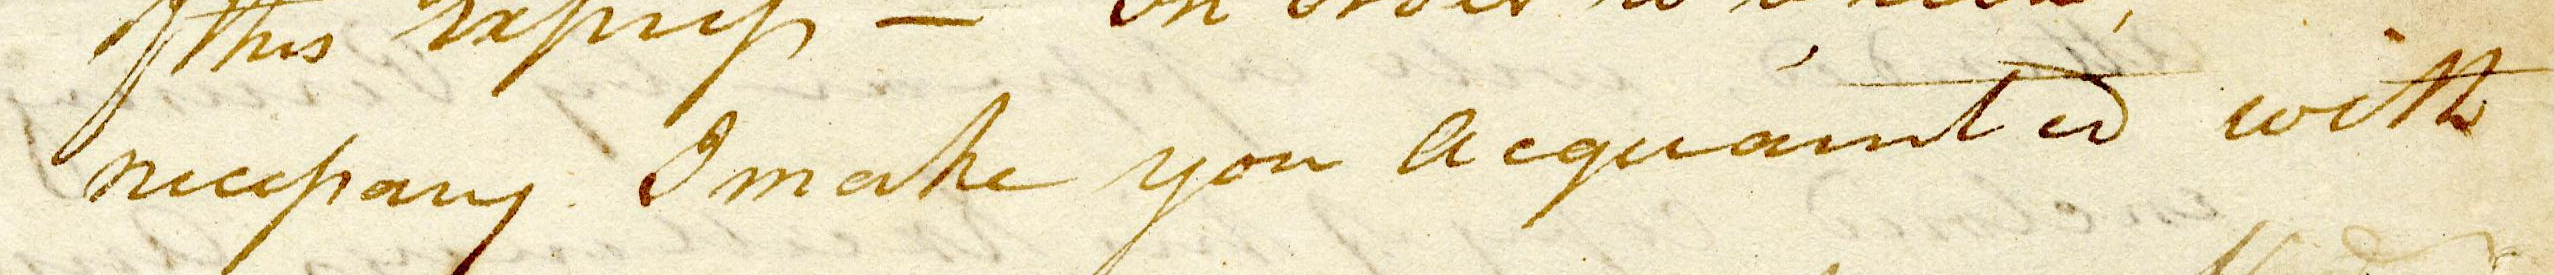necessary I make you Acquainted with
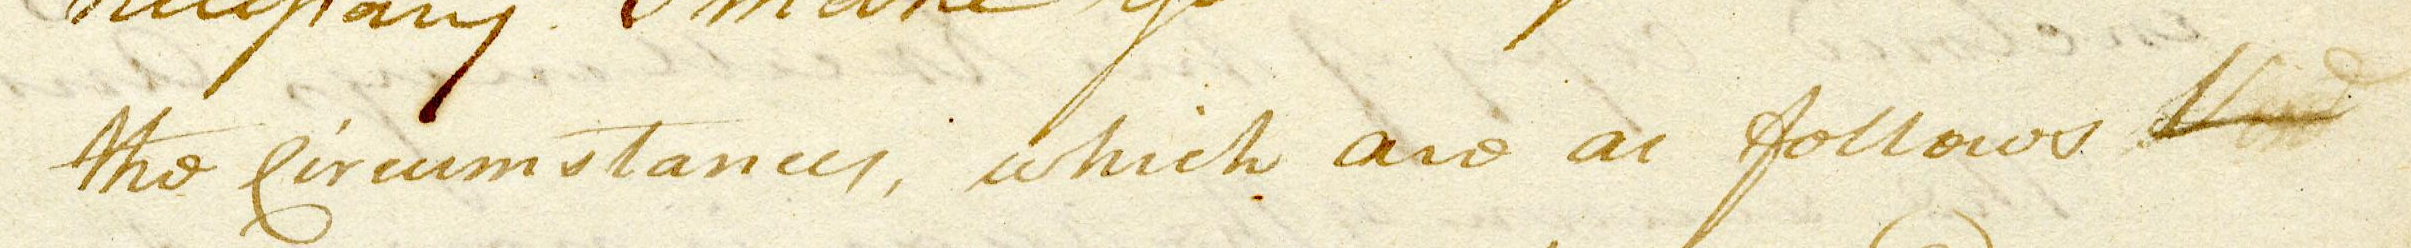the Circumstances, which are as follows [___]
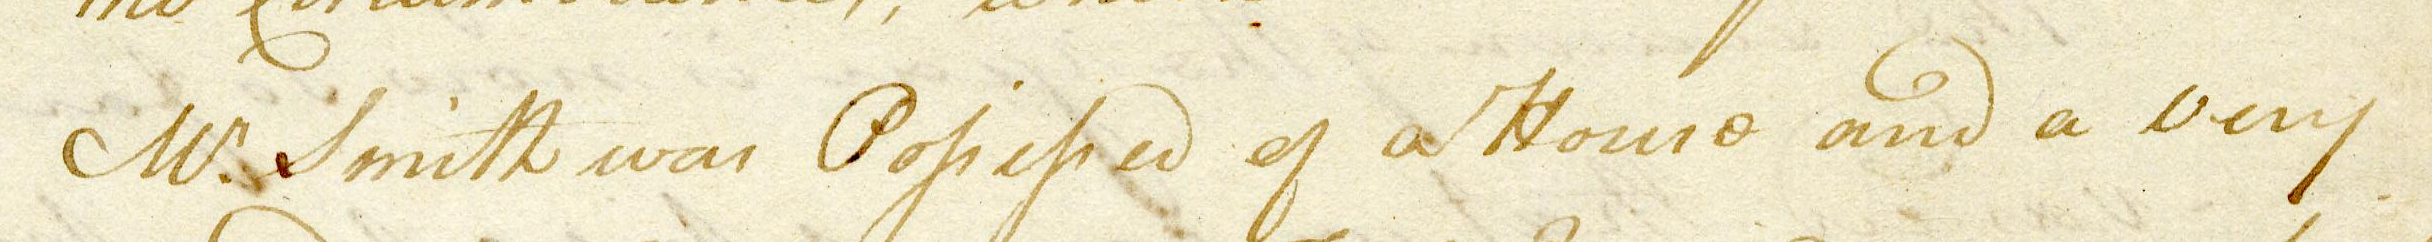M^r. Smith was Possessed of a House and a very
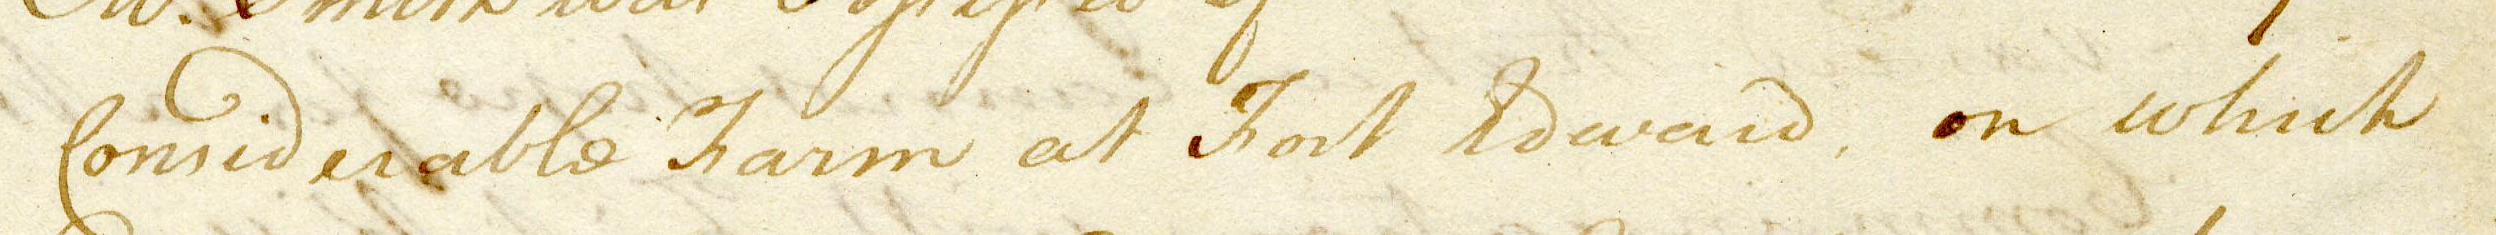Considerable Farm at Fort Edward on which
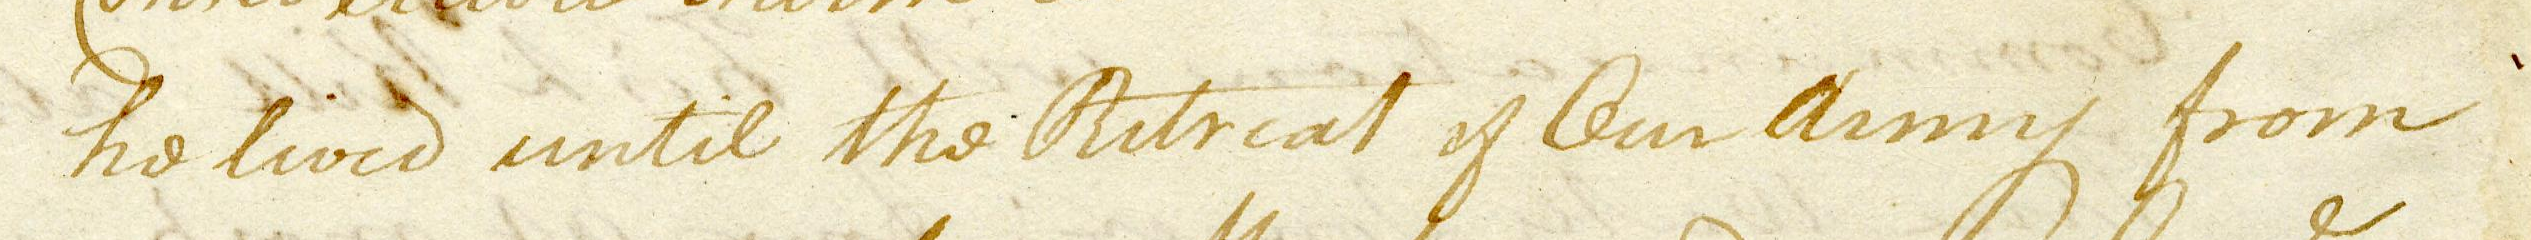he lived until the Retreat of OUr Army from
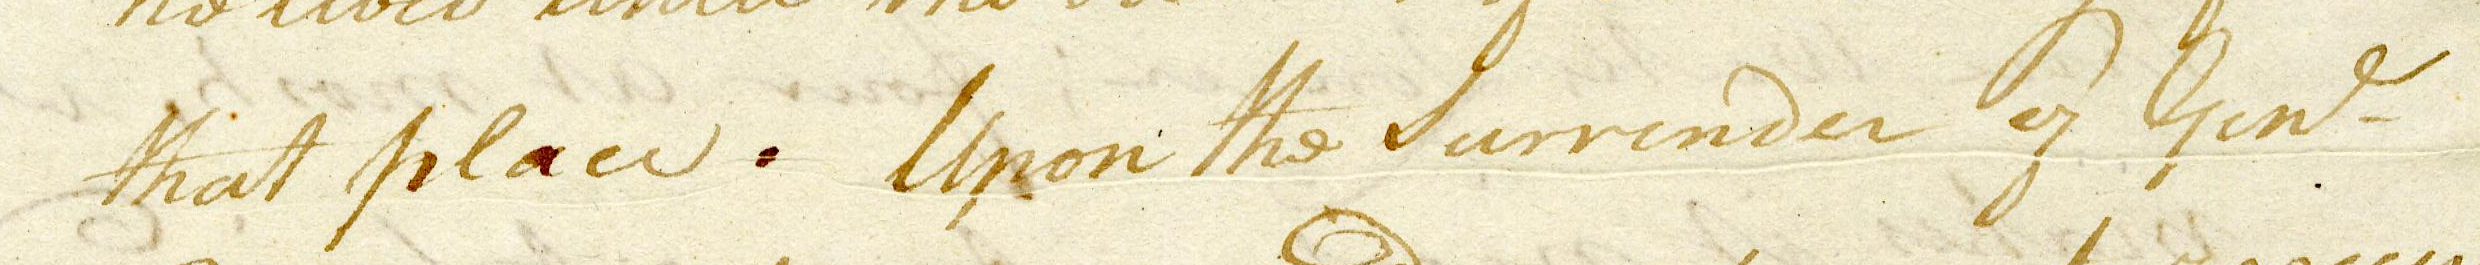that place. Upon the Surrender of Gen^l.
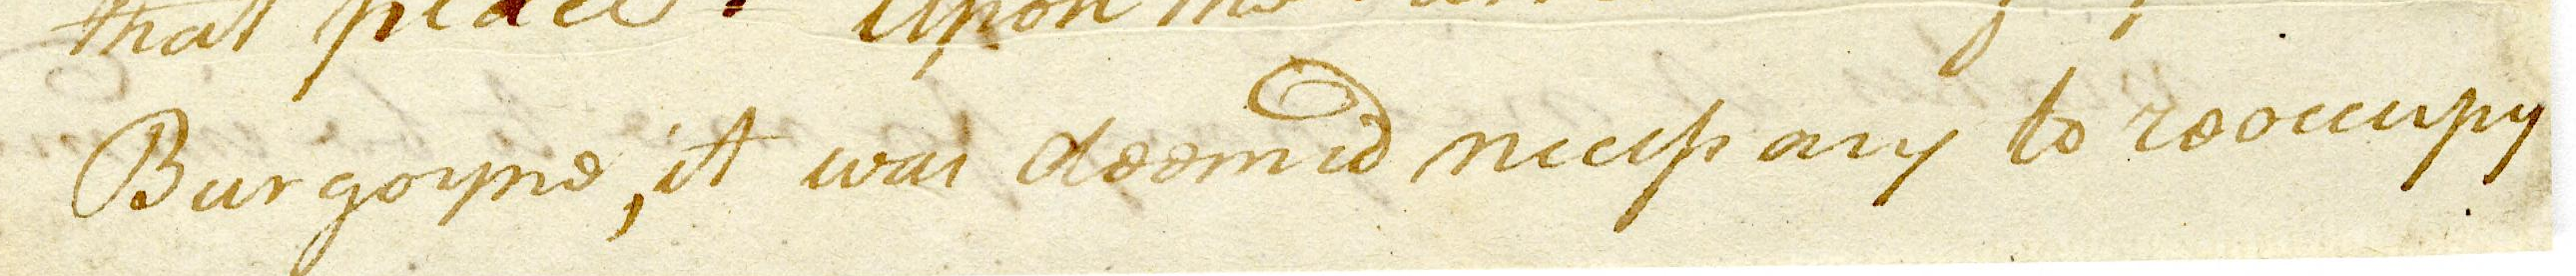Burgoyne, it was deem'd necessary to reoccupy
